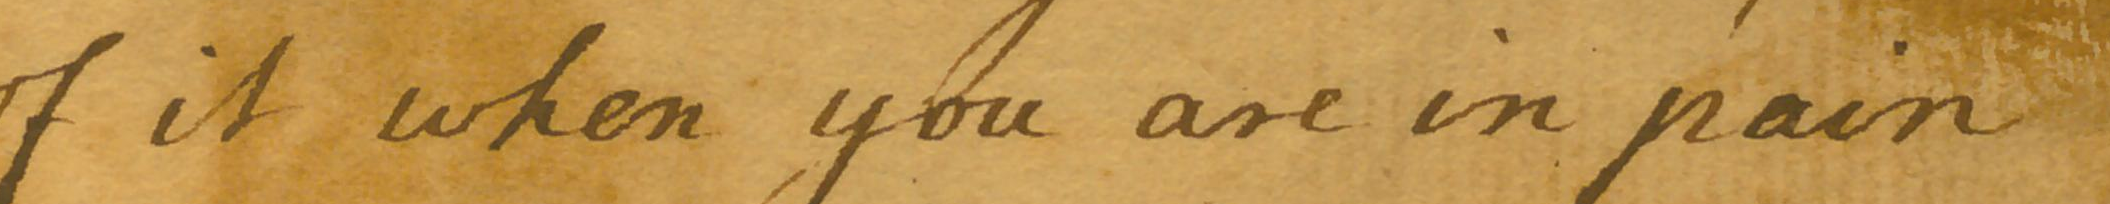of it when you are in pain
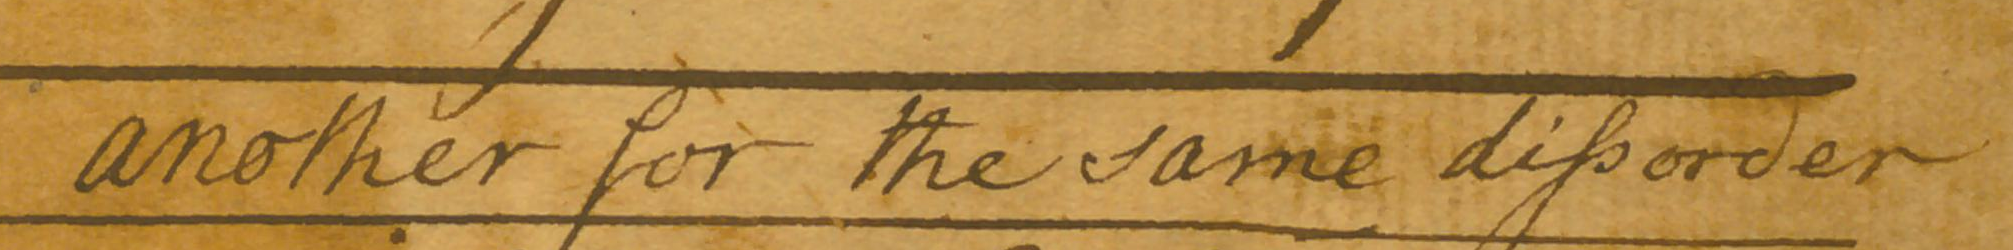another for the same disorder
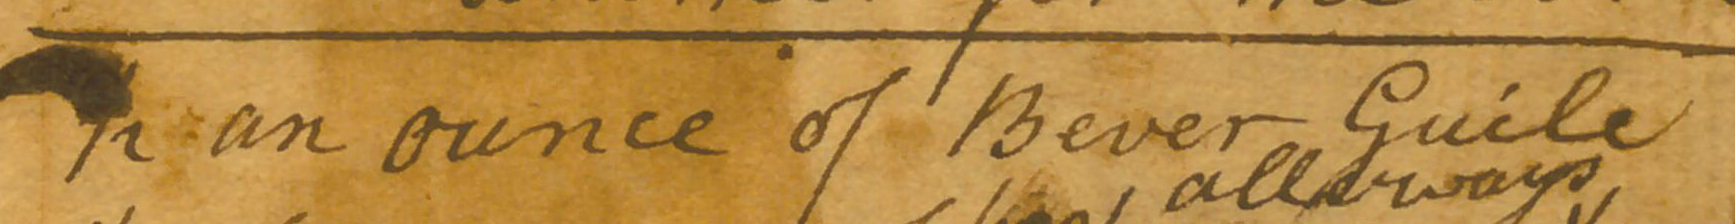In an ounce of Bever Guile
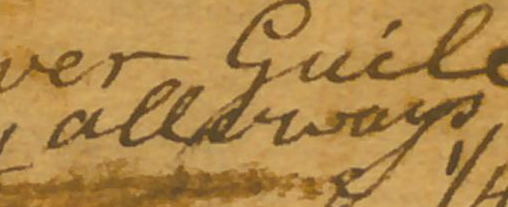alleways
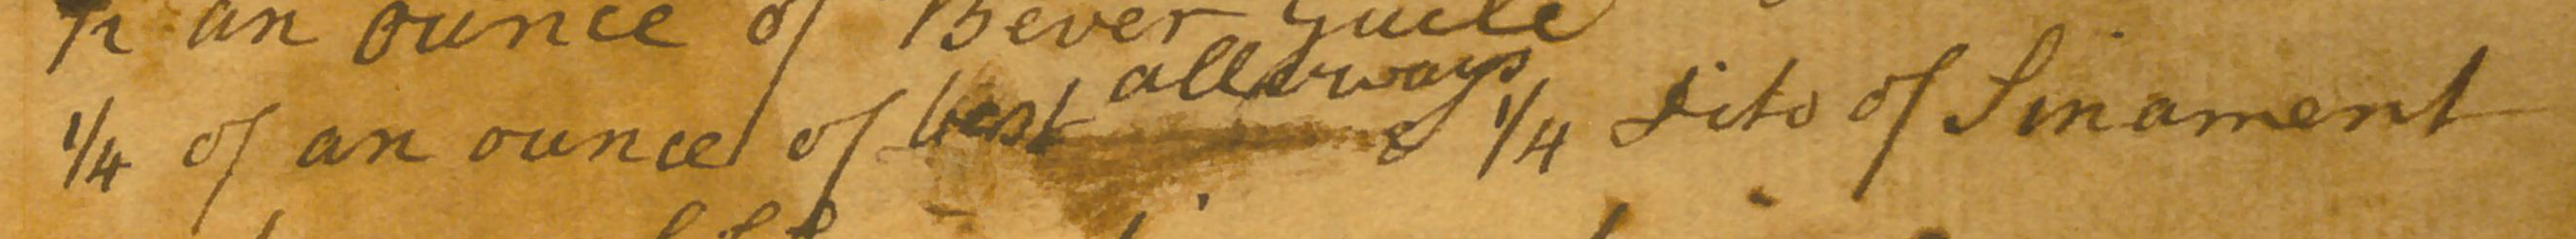1/4 of an ounce of best 1/4 dito of Sinament
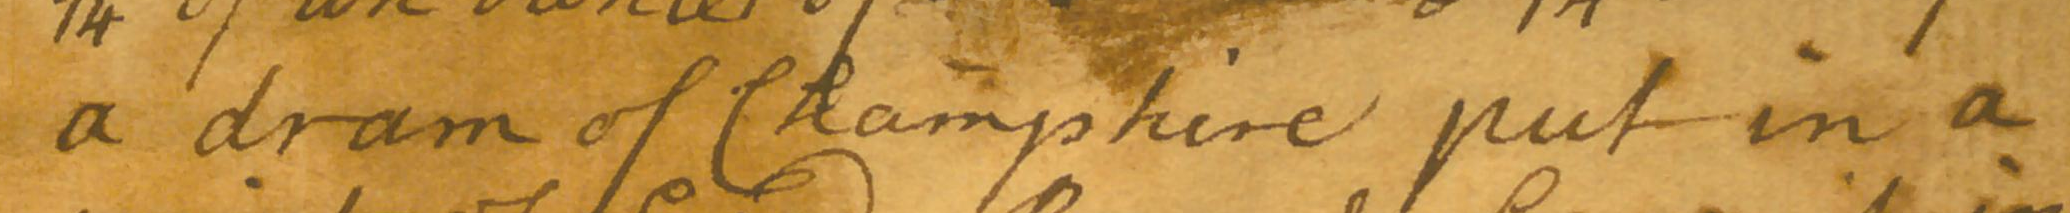a dram of Champhire put in a
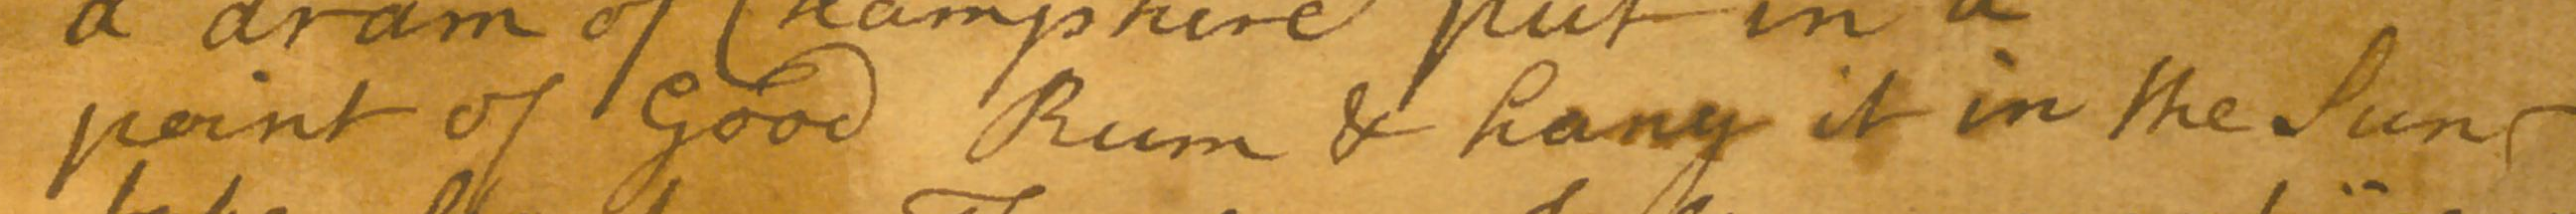peint of Good Rum & hang it in the sun
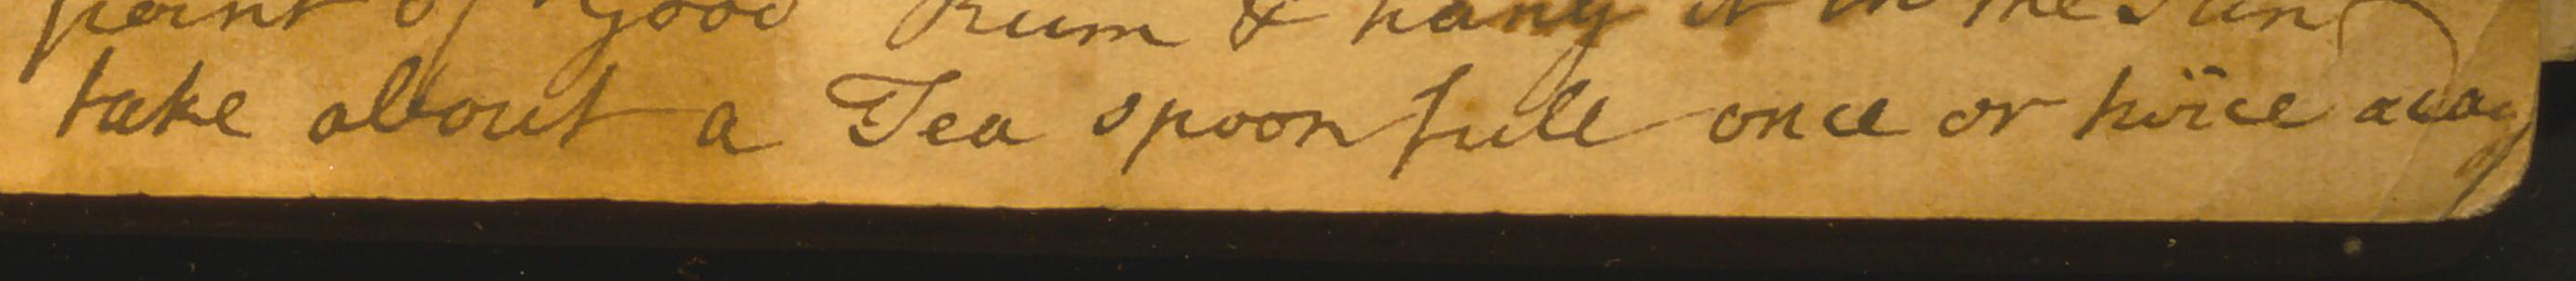take about a Tea spoon full once or twice a day
